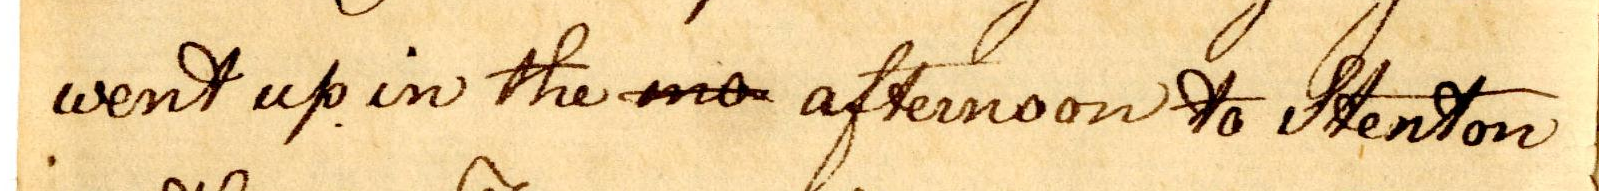went up in the [mo] afternoon to Stenton
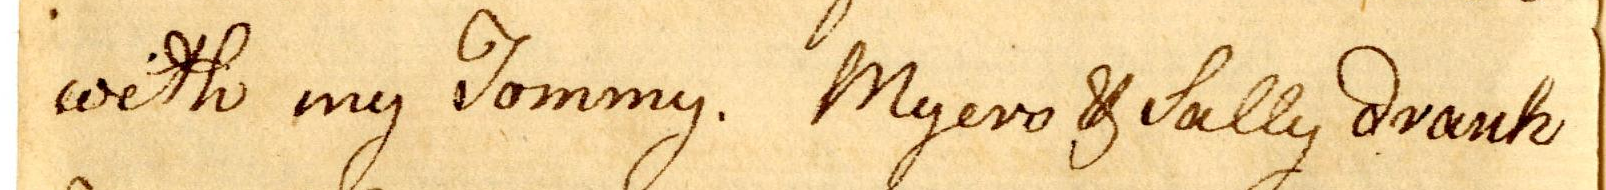with my Tommy. Myers & Sally drank
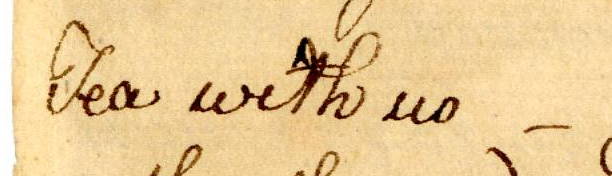Tea with us-
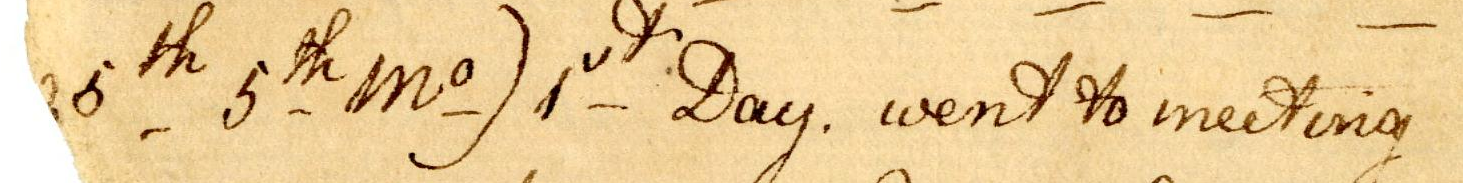25^th 5^th M^o ) 1^st Day. went to meeting
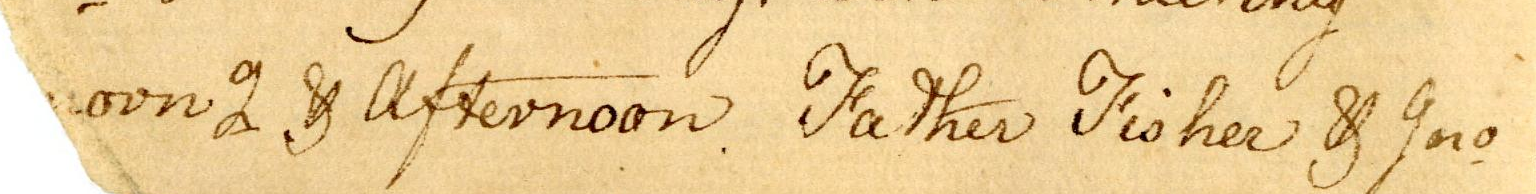morn^g & Afternoon Father Fisher & Jno
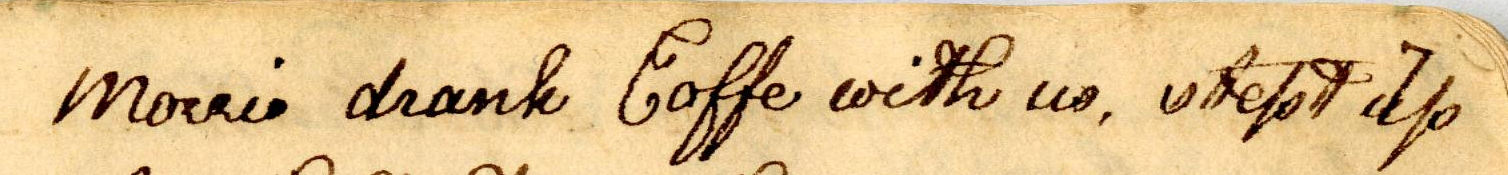Morris drank Coffe with us, stept up
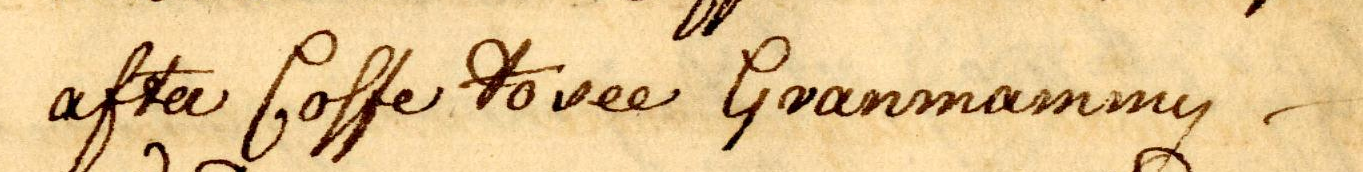after Coffe to see Granmammy-
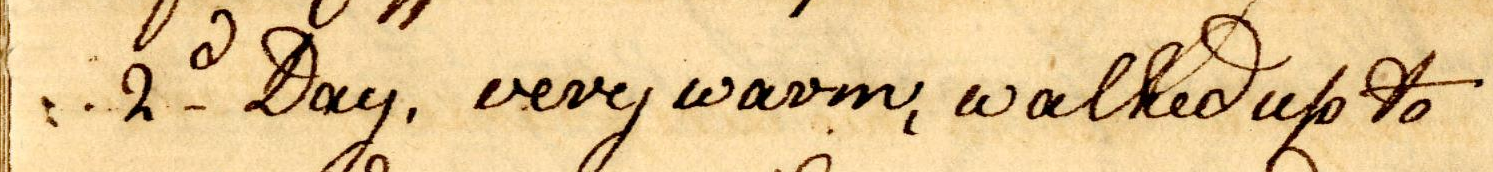2^d Day. very warm, walked up to
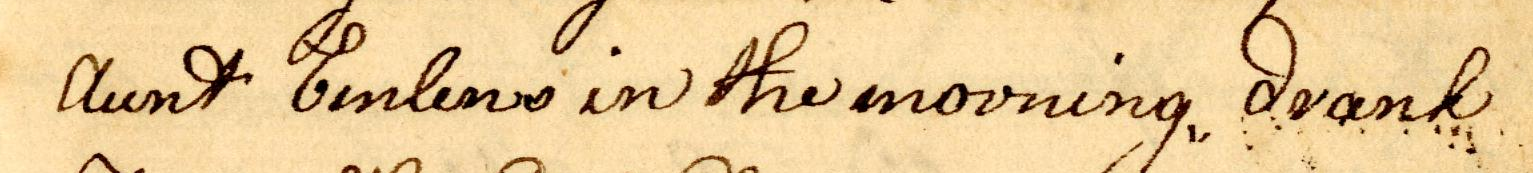Aunt Emlens in the morning, drank
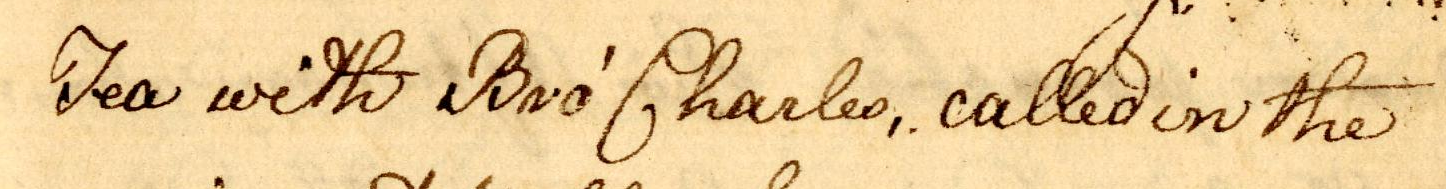Tea with Bro' Charles, called in the
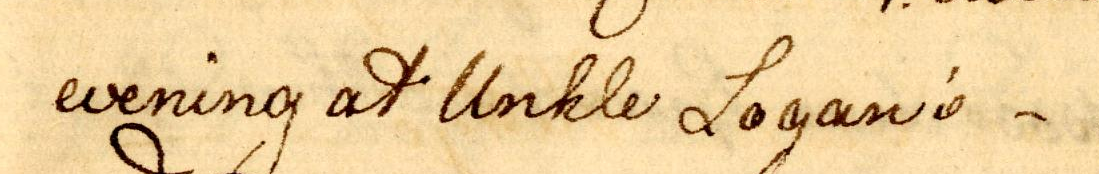evening at Unkle Logan's-
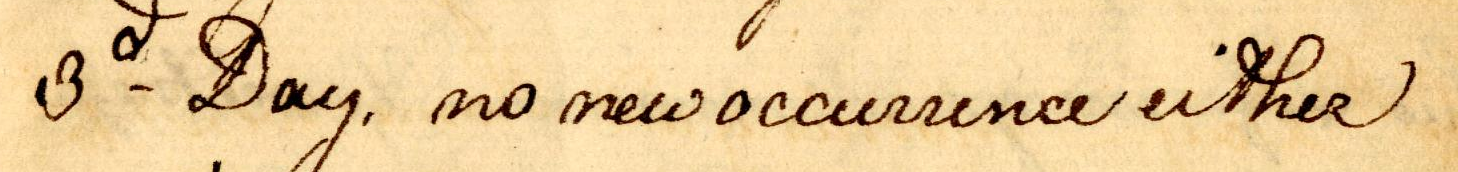3^d Day. no new occurrence either
